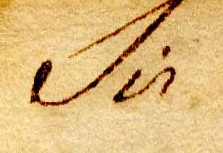Sir
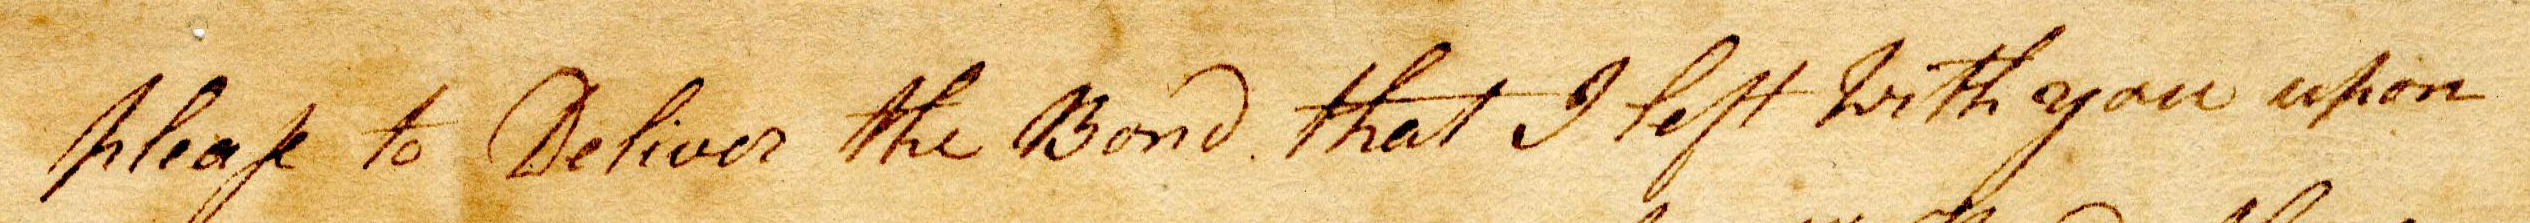please to Deliver the Bond that I left with you upon
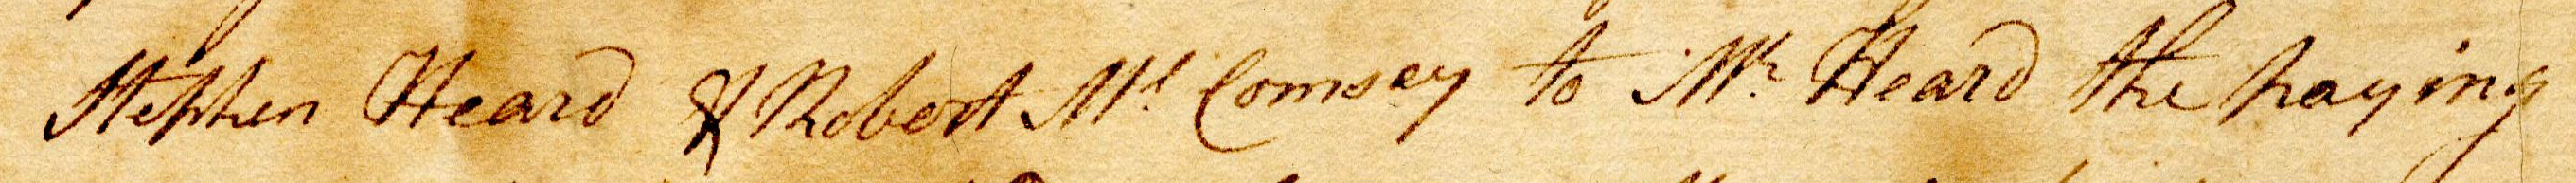Stephen Heard & Robert M^t. Comsey to M^r. Heard the paying
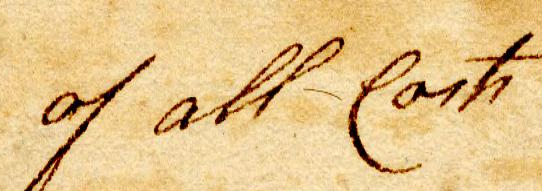of all Costs
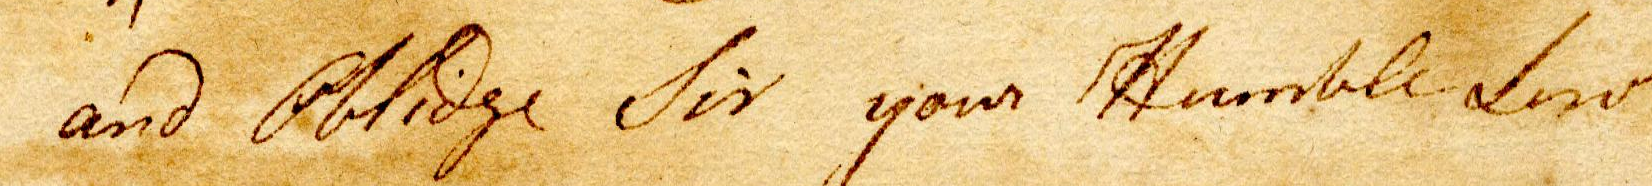and Oblidge Sir your Humble Serv^t
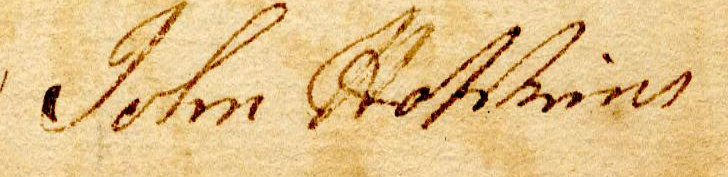John Hopkins
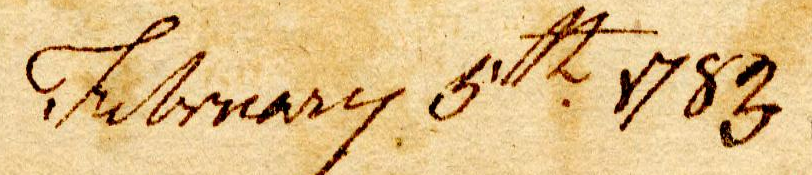February 5^th. 1783
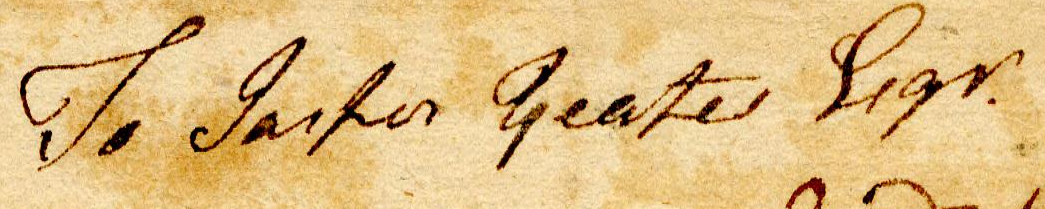To Jasper Yeates Esq^r.
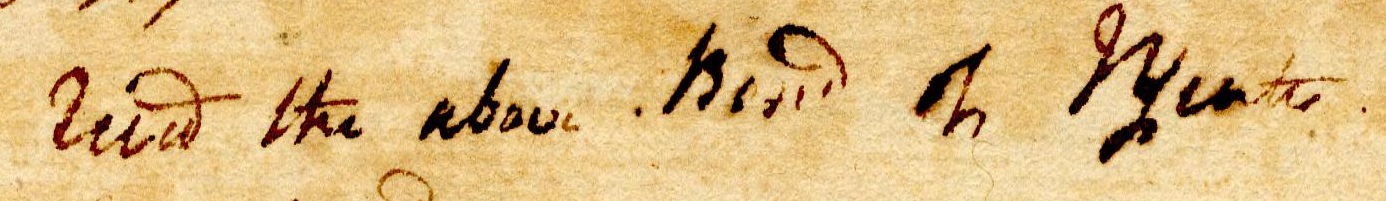Reced the above Bond of J Yeates
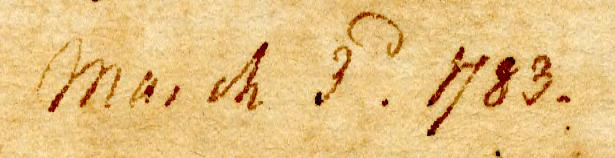March 3^d. 1783.
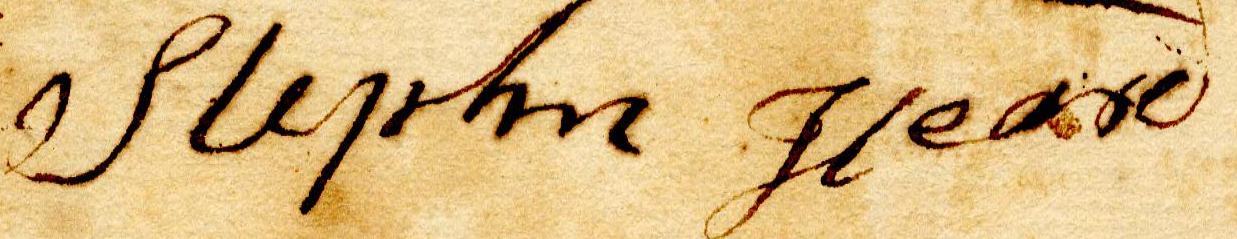Slephen Heare
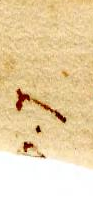.7
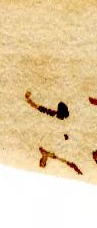7.6
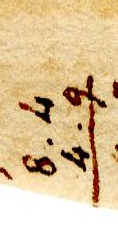8.4
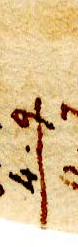4.9
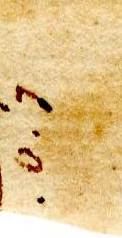0.7
